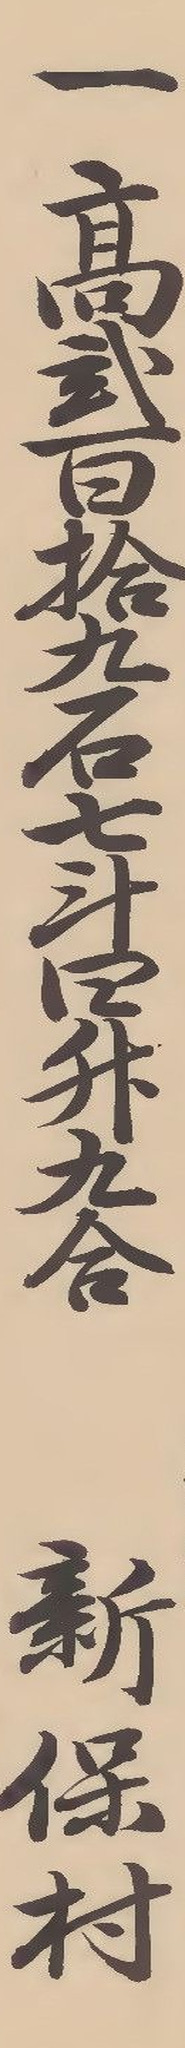一高弐百拾九石七斗四升九合新保村
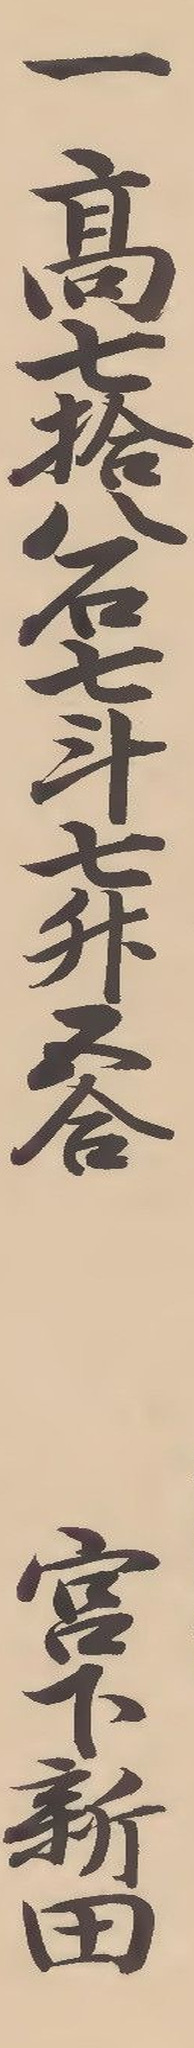一高七拾八石七斗七升五合宮下新田
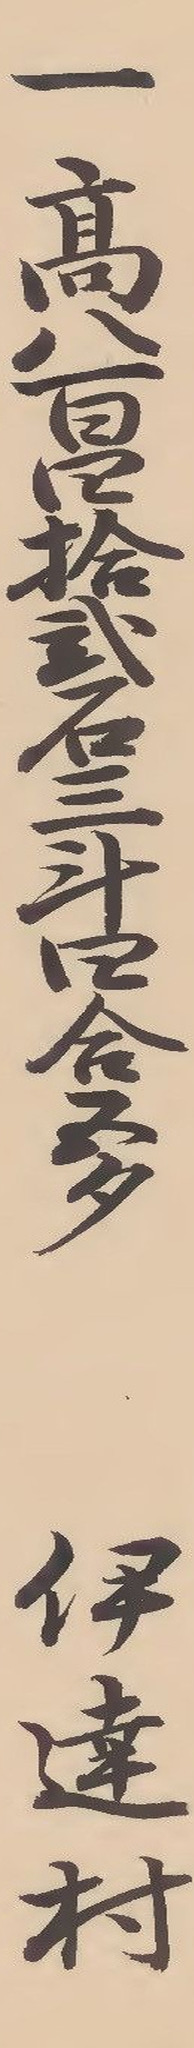一高八百四拾弐石三斗四合五勺伊達村
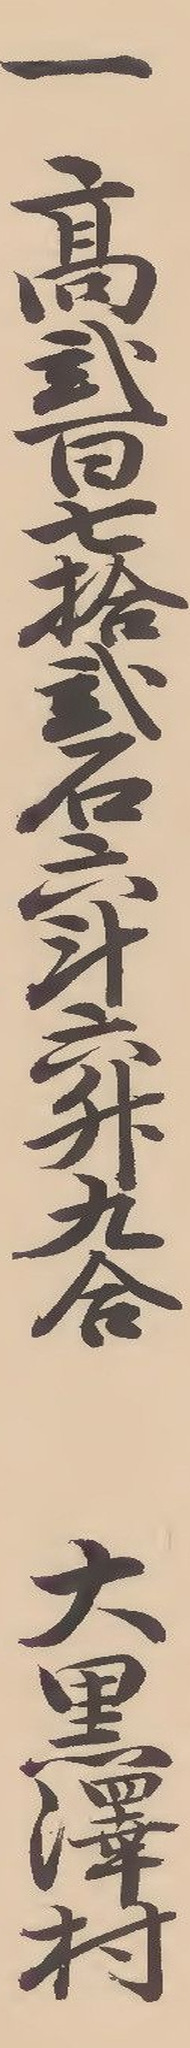一高弐百七拾弐石六斗六升九合大黒沢村

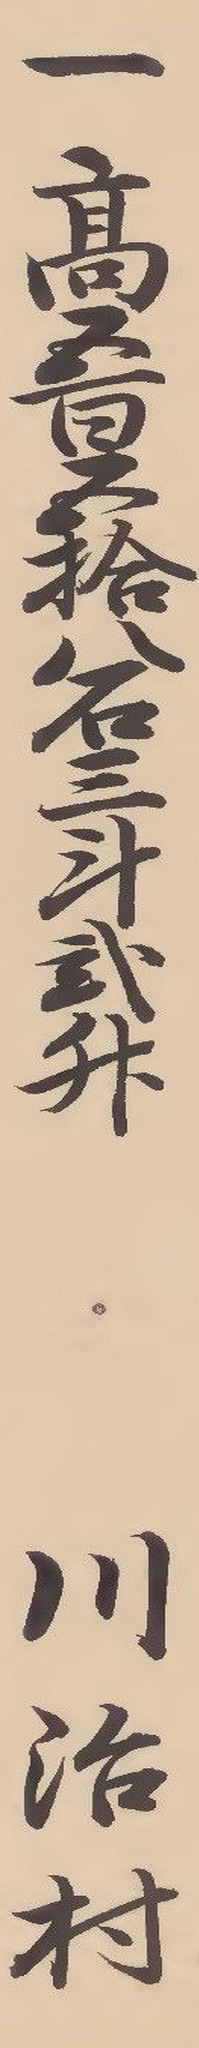一高五百五拾八石三斗弐升川治村
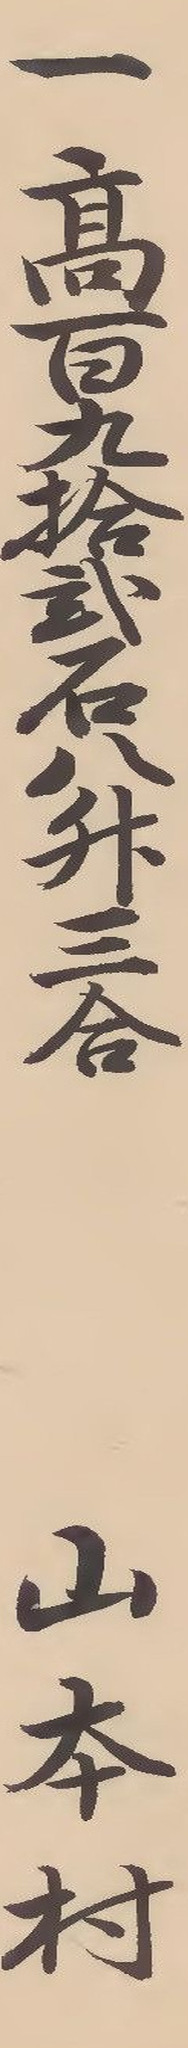一高百九拾弐石八升三合山本村
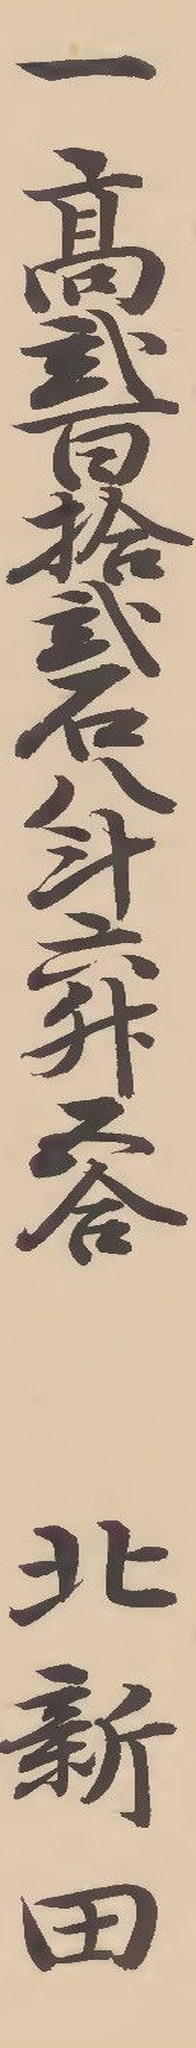一高弐百拾弐石八斗六升五合北新田
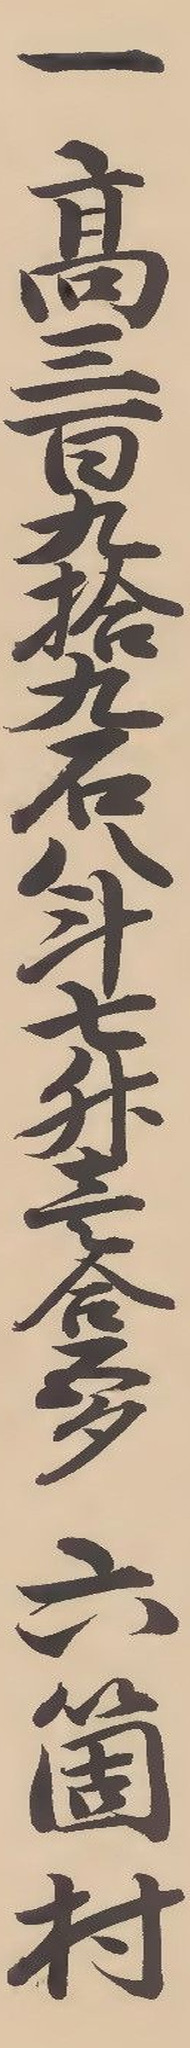一高三百九拾九石八斗七升壱合五勺六箇村
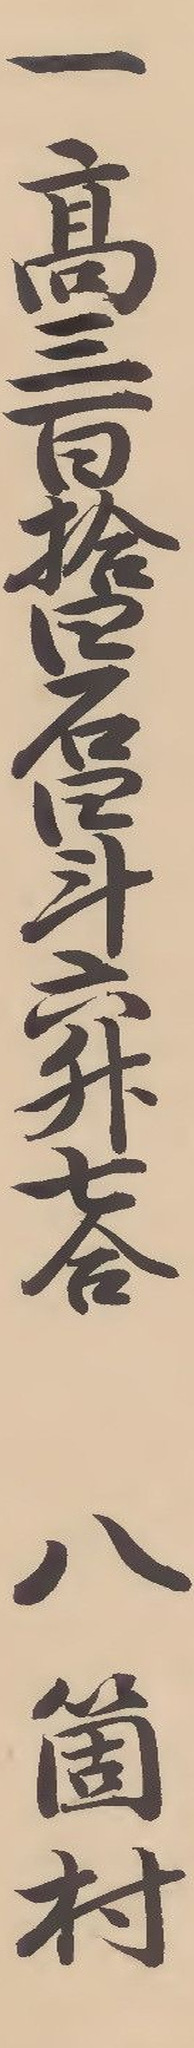一高三百拾四石四斗六升七合八箇村
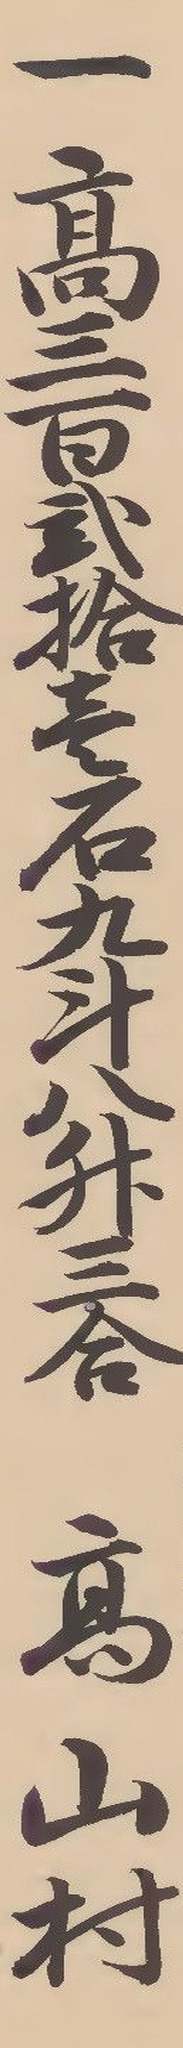一高三百弐拾壱石九斗八升三合高山村

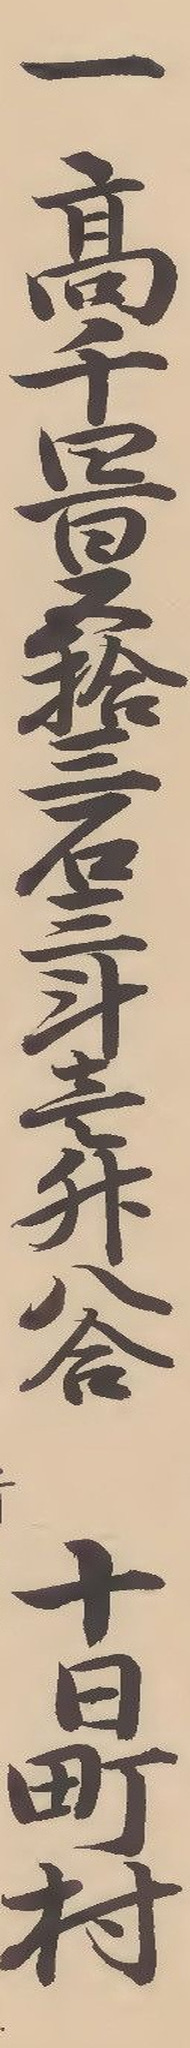一高千四百五拾三石三斗壱升八合十日町村
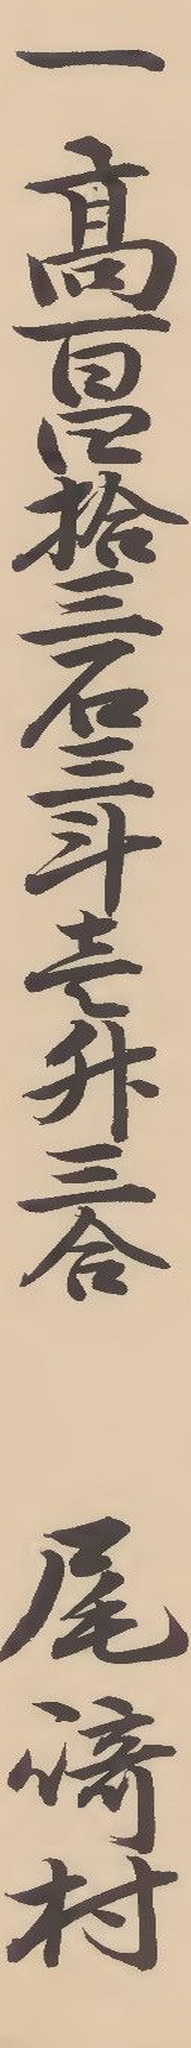一高百四拾三石三斗壱升三合尾崎村
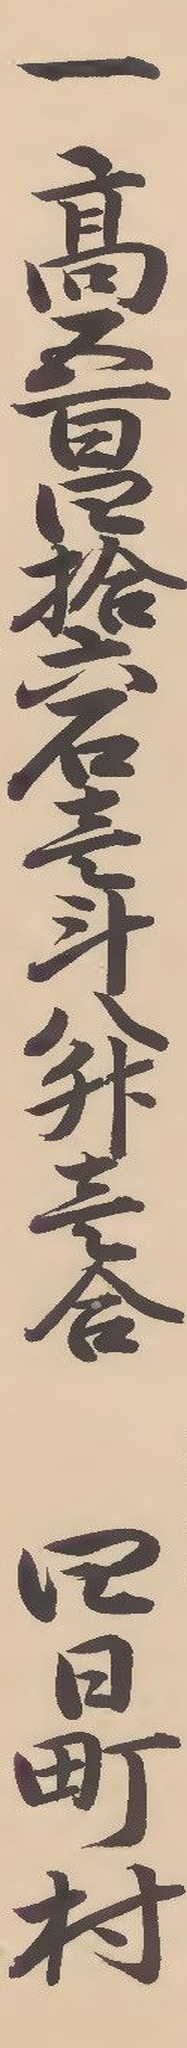一高五百四拾六石壱斗八升壱合四日町村

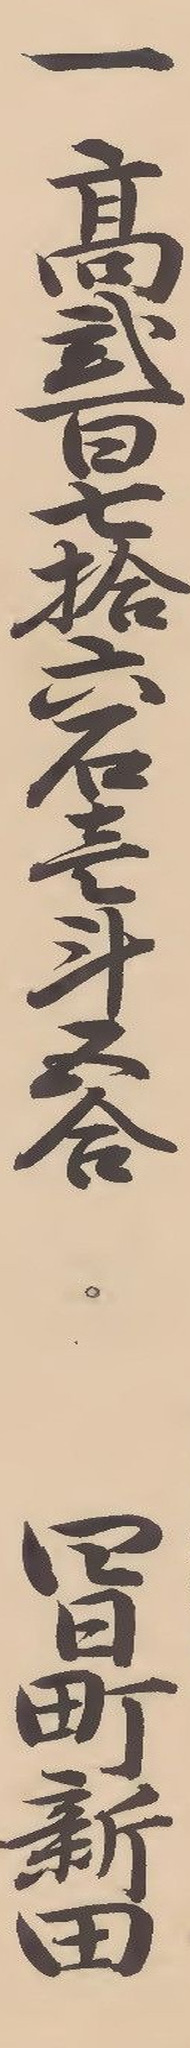一高弐百七拾六石壱斗五合四日町新田
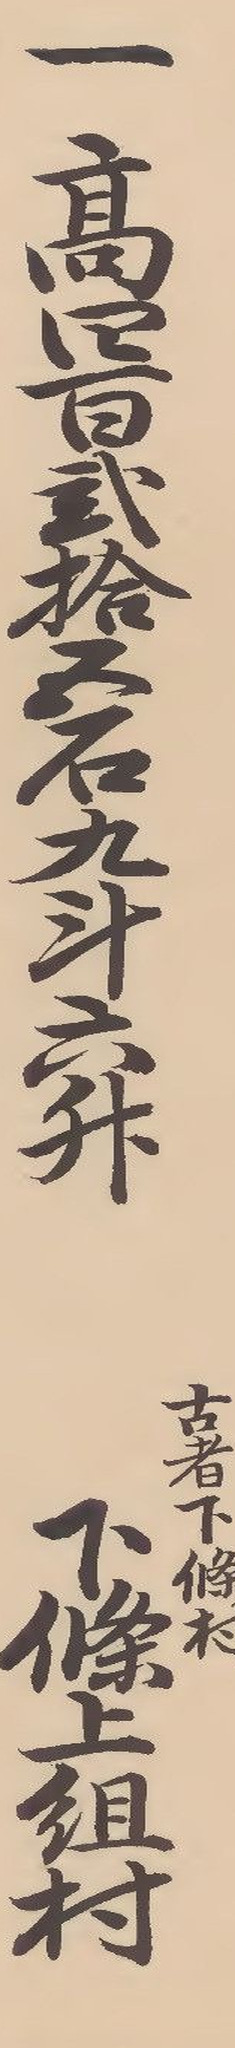一高四百弐拾五石九斗六升下条上組村
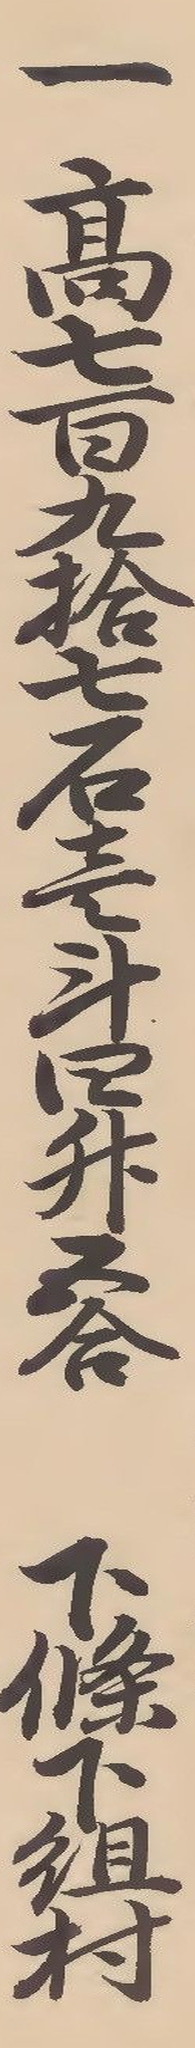一高七百九拾七石壱斗四升五合下条下組村
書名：越後国郷帳　中
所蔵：国立公文書館 National Archives of Japan
